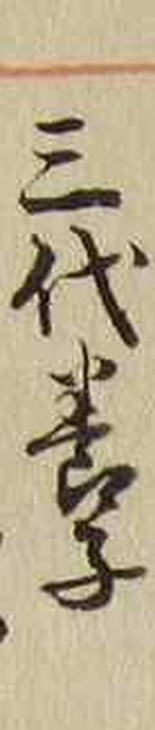三代養子
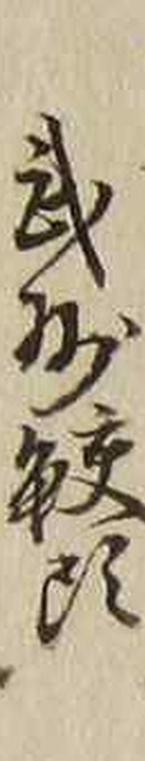武州鮫頭
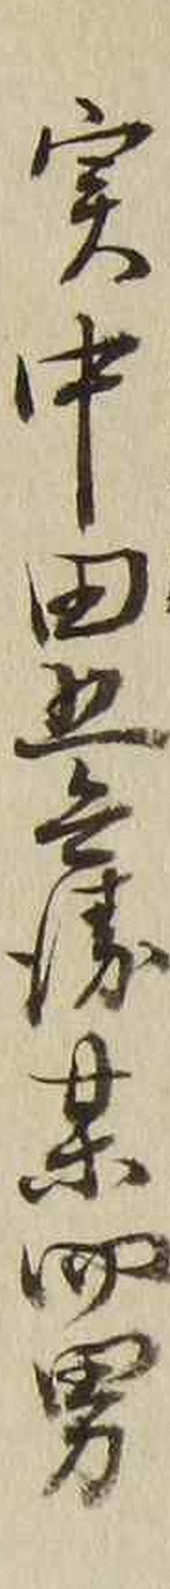実中田上兵衛某四男

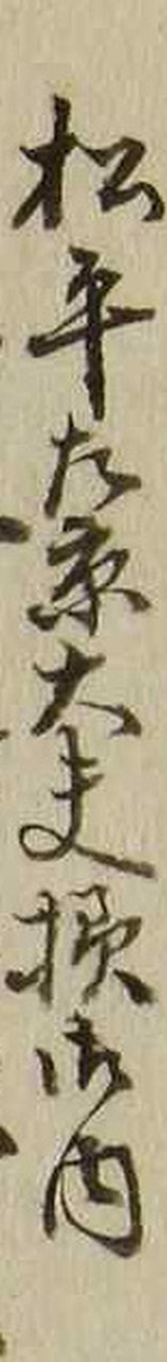松平左京太夫様御内
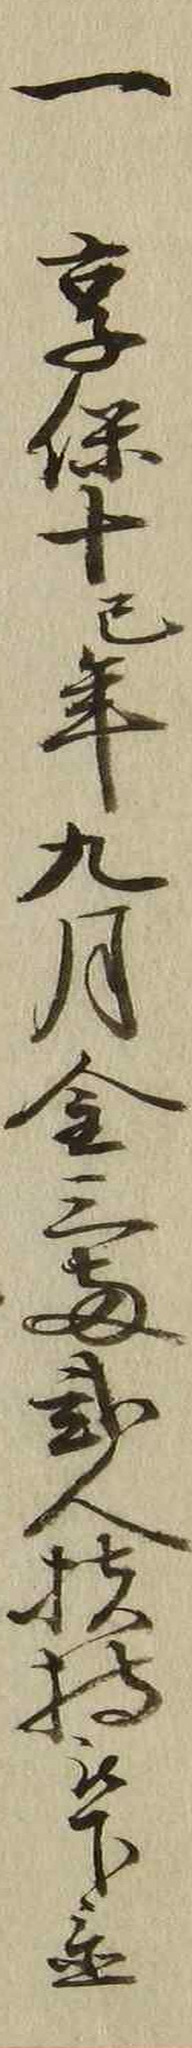一享保十巳年九月金三両弐人扶持被下置
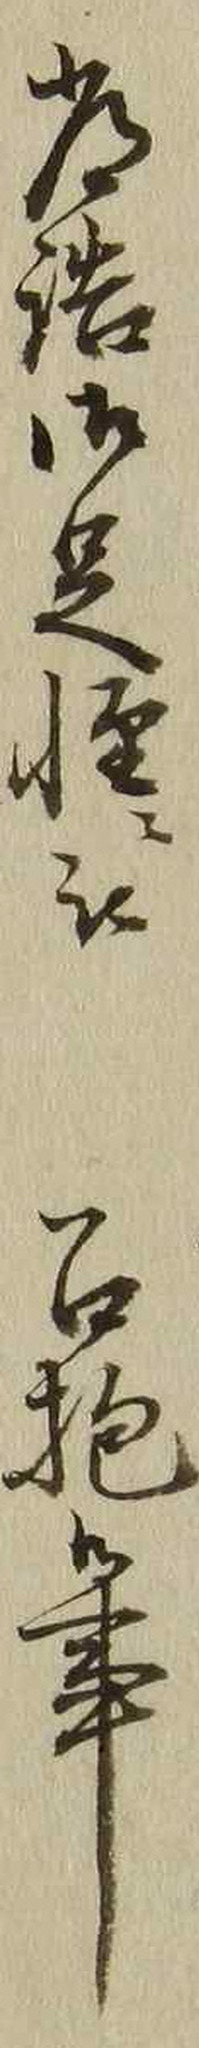常詰御足軽ニ被召抱候事
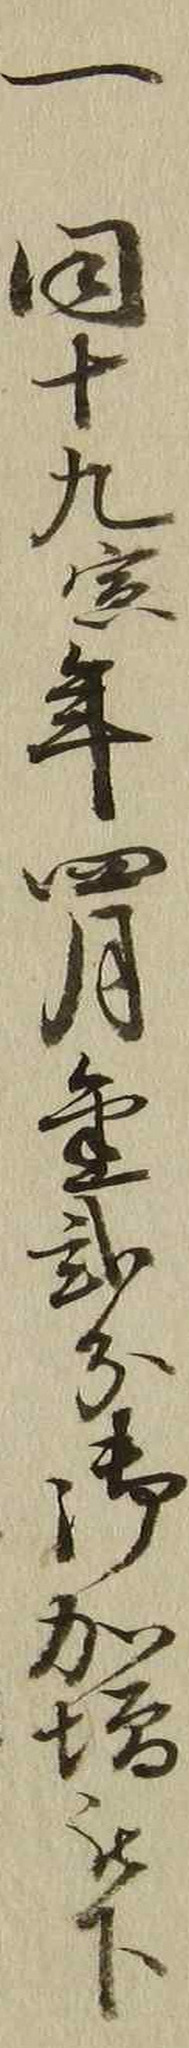一同十九寅年四月金弐分御加増被下
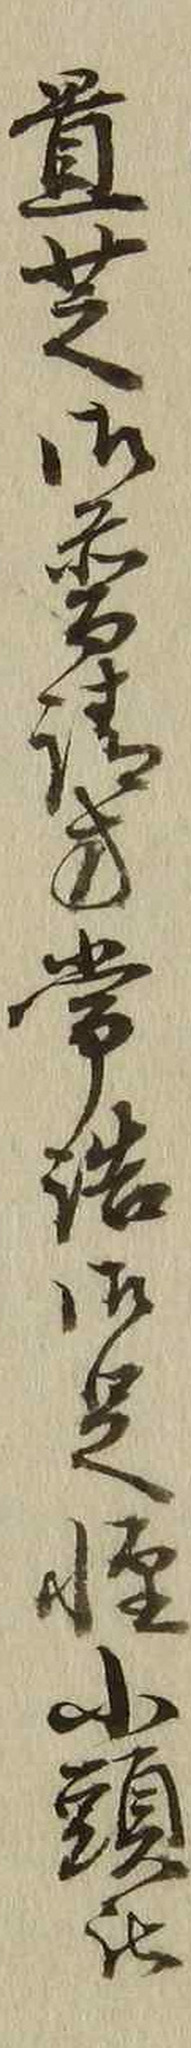置芝御普請方常詰御足軽小頭被
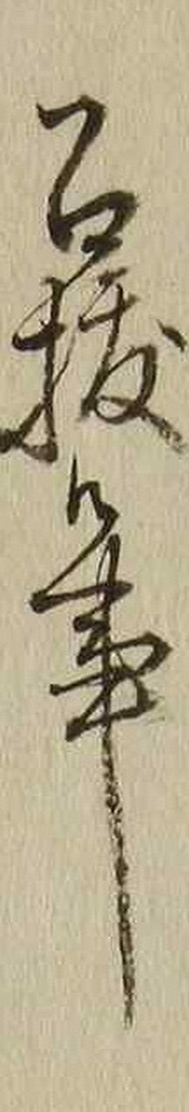召抜候事
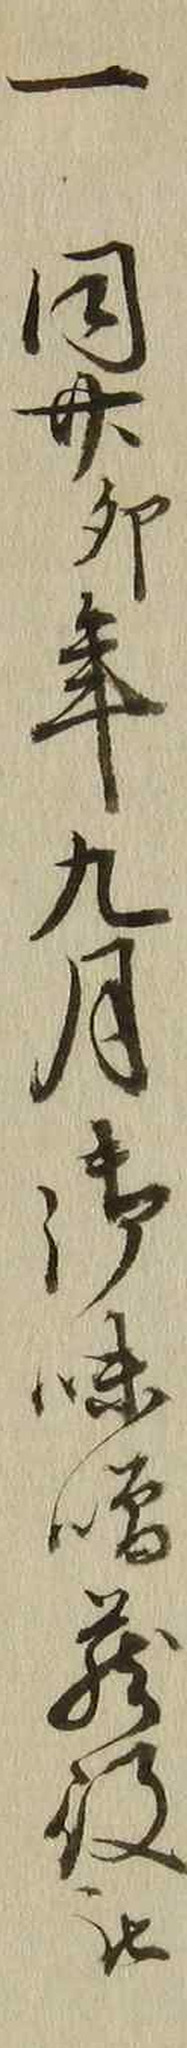一同廿卯年九月御味噌藏役被
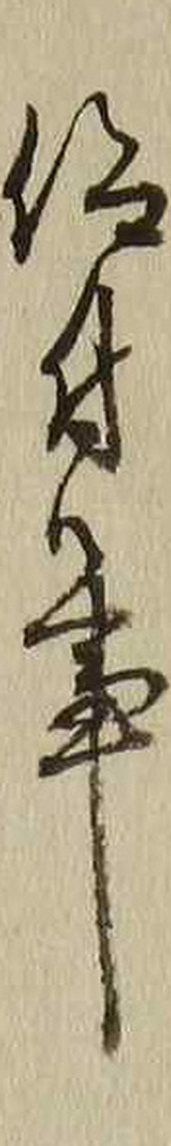仰付候事
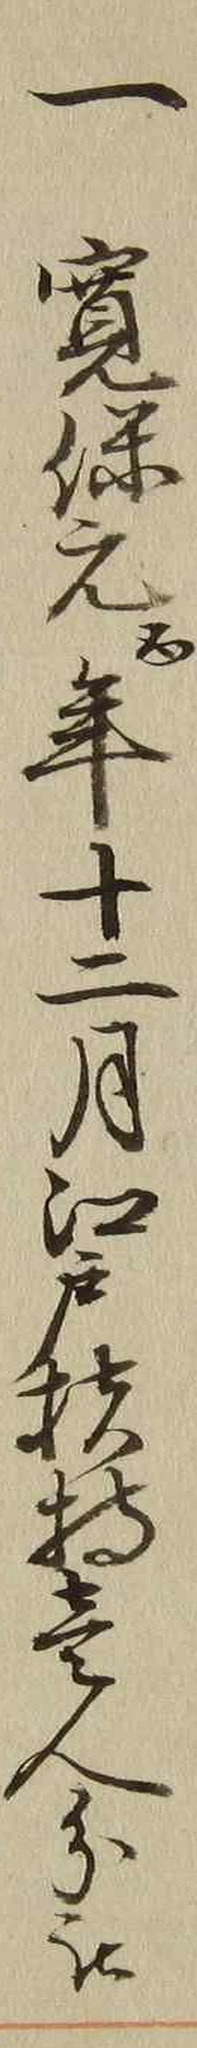一寛保元酉年十二月江戸指持壱人分被
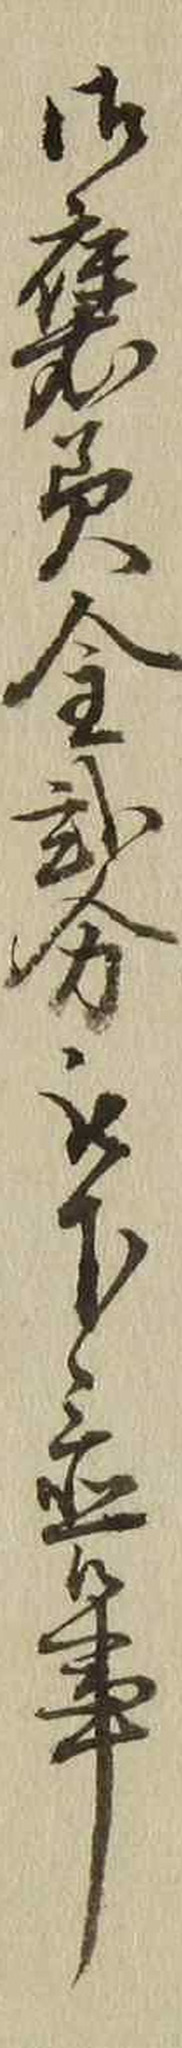御褒美金弐分被下置候事
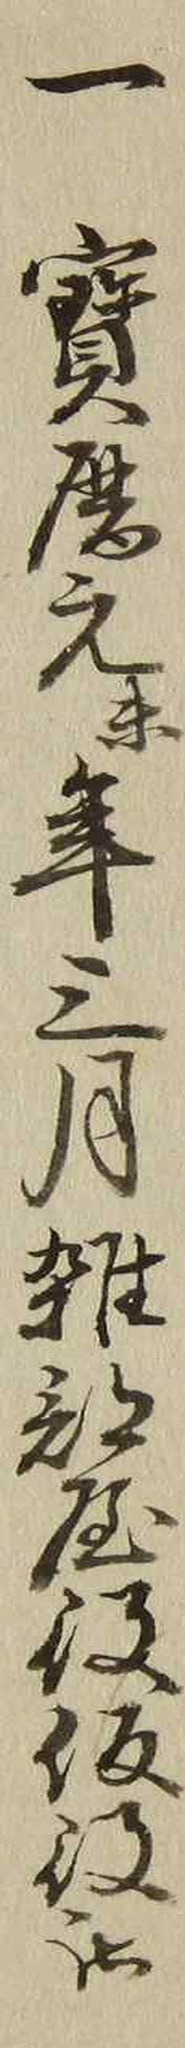一宝暦元未年三月雑部屋役仮役被
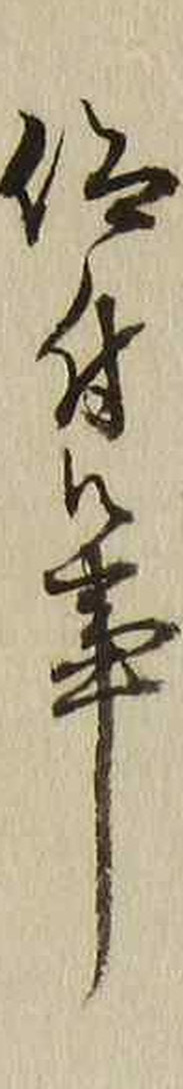仰付候事
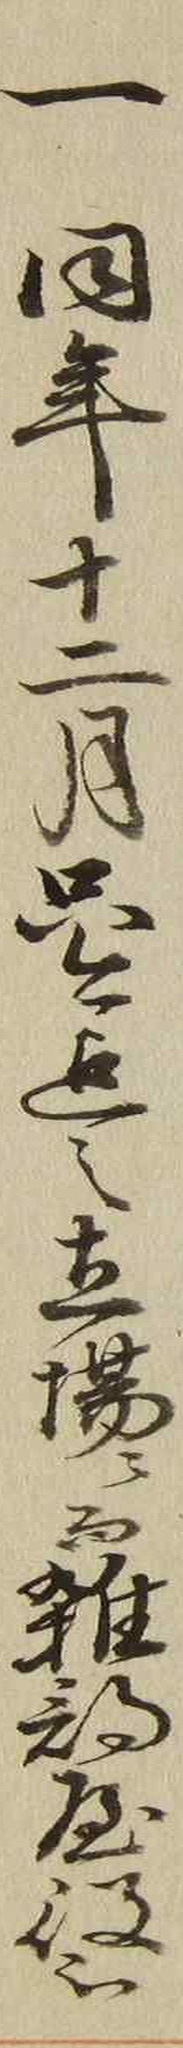一同年十二月只今迄之立場ニ而雑部屋役被
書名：諸士系譜　巻之64　と之部7
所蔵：会津若松市立会津図書館
